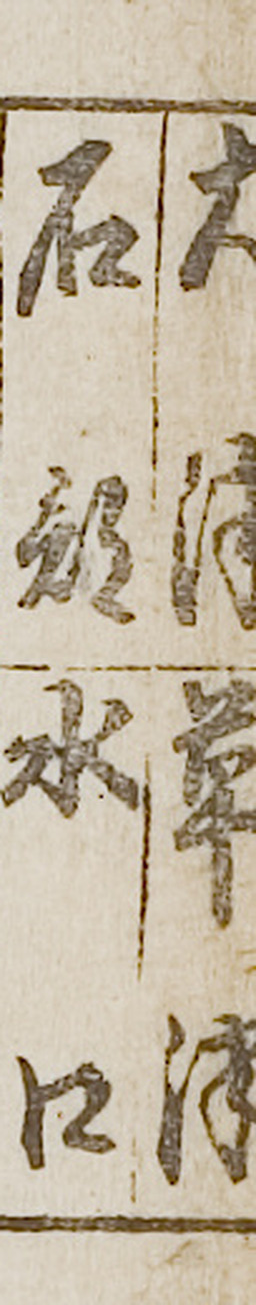石部水口
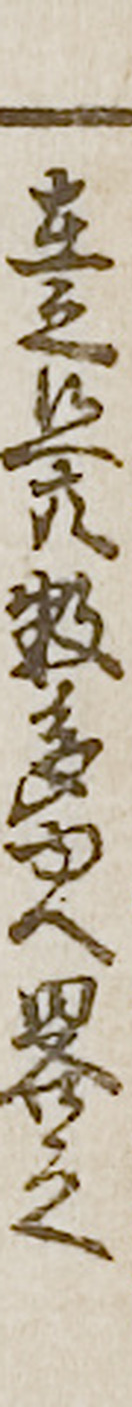在之候へ共数多ゆへ略也
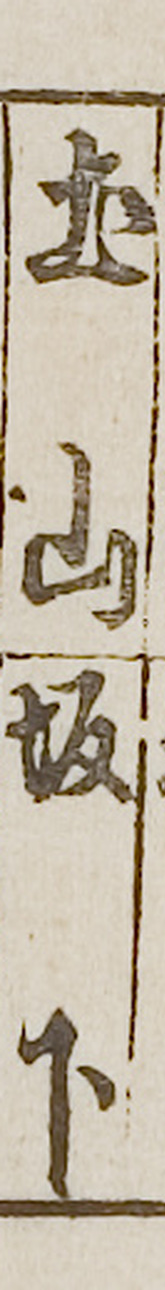土山坂下
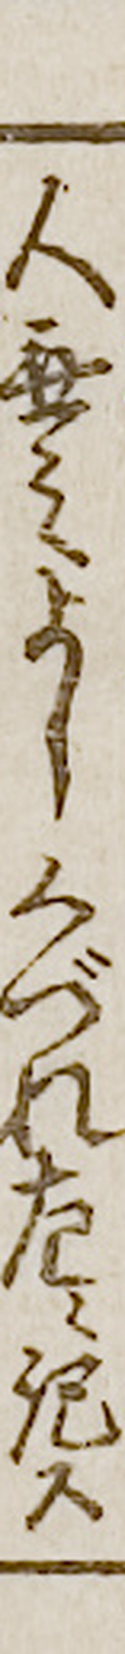人無之よりくづれ左に記す
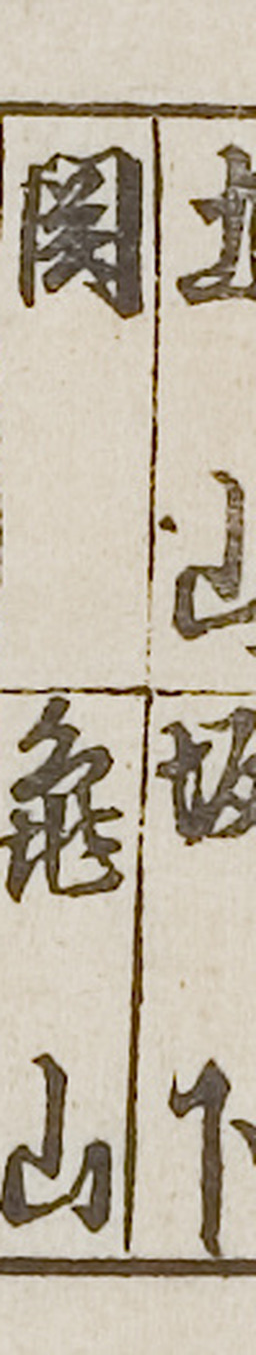関亀山
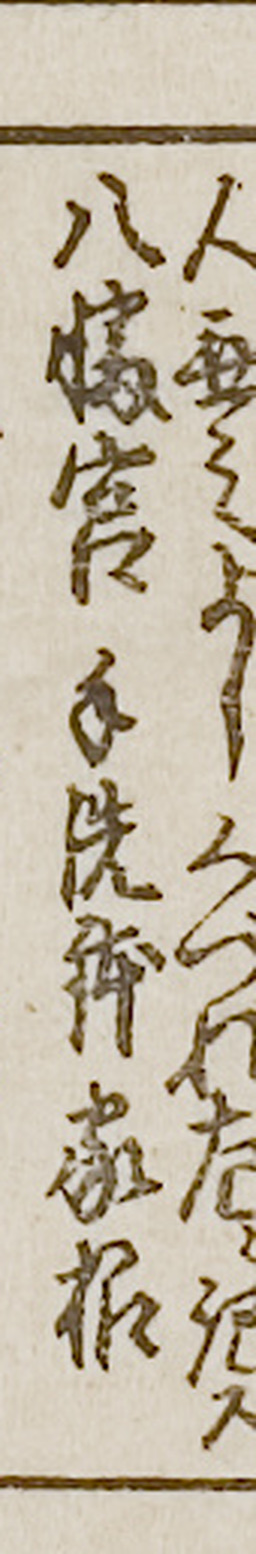八幡宮手洗鉢家根
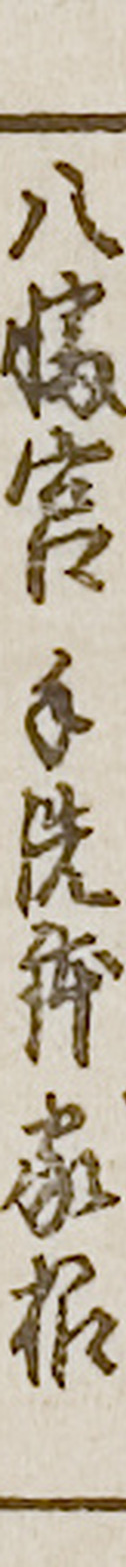八幡宮手洗鉢家根
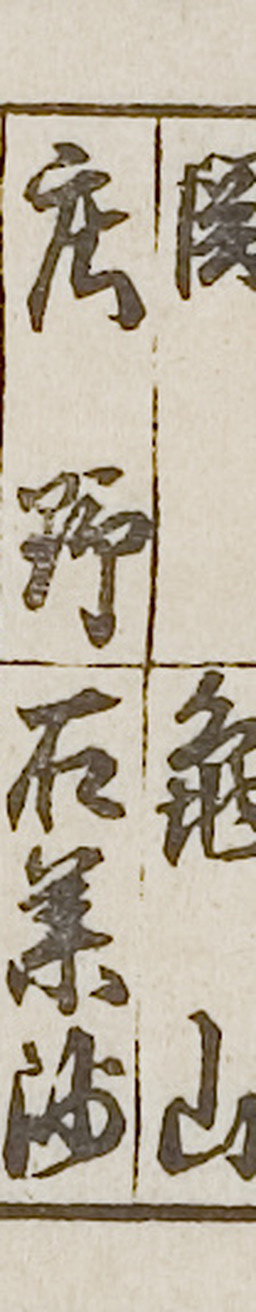庄野石薬師
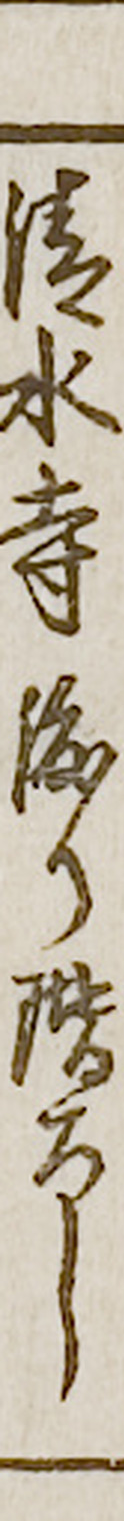清水寺渡り階ろう
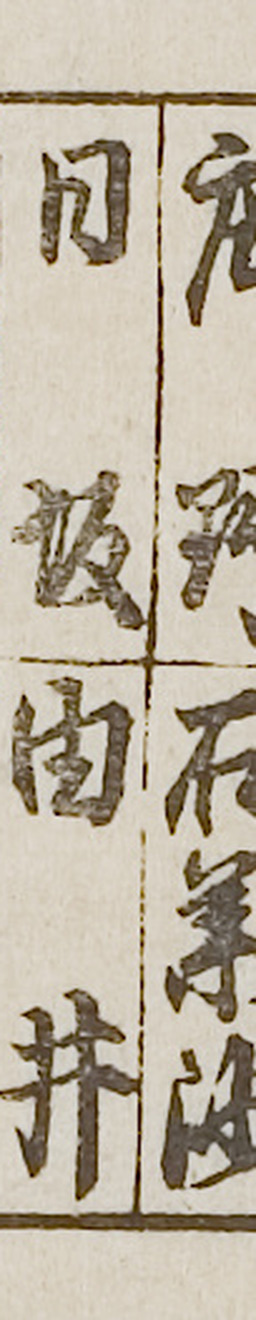日坂由井
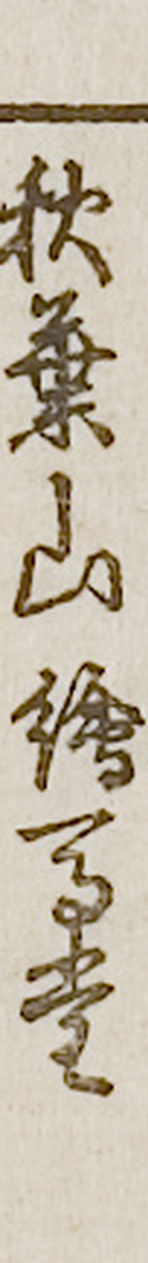秋葉山絵馬堂
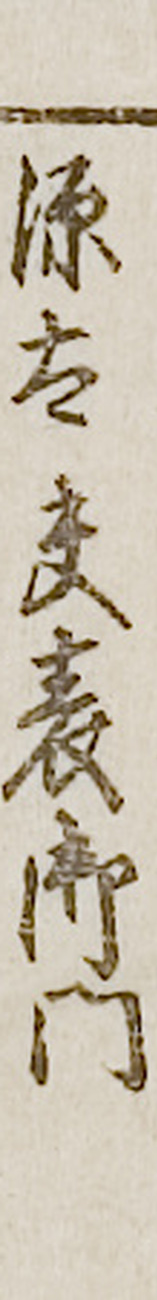源太夫表御門
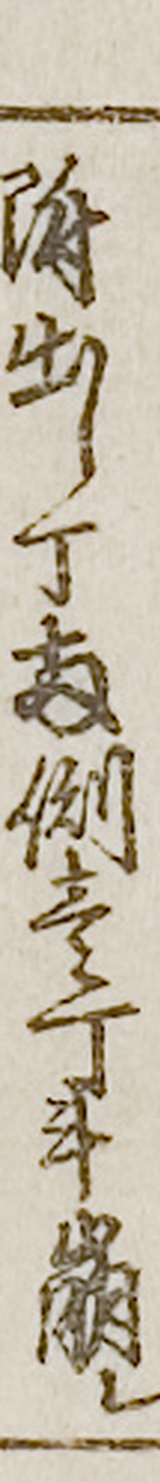附出し丁両側壱丁斗崩れ
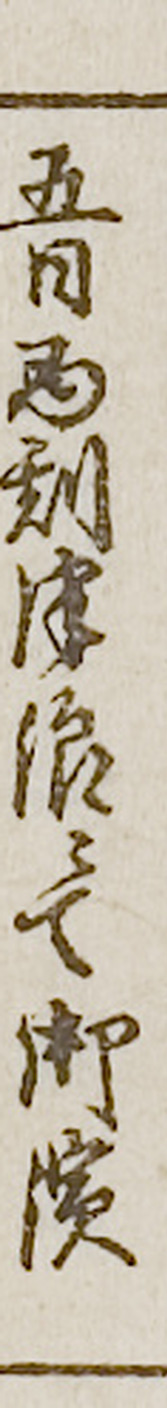五日酉刻津浪にて御浜
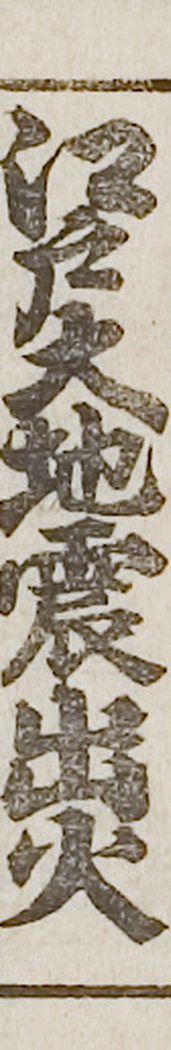江戸大地震出火
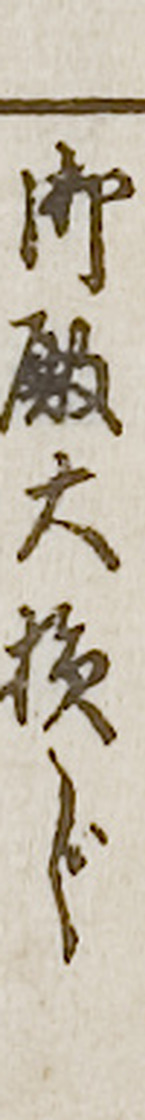御殿大損じ
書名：大阪大地震一覧
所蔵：東京大学総合図書館 General Library in the University of Tokyo, JAPAN
